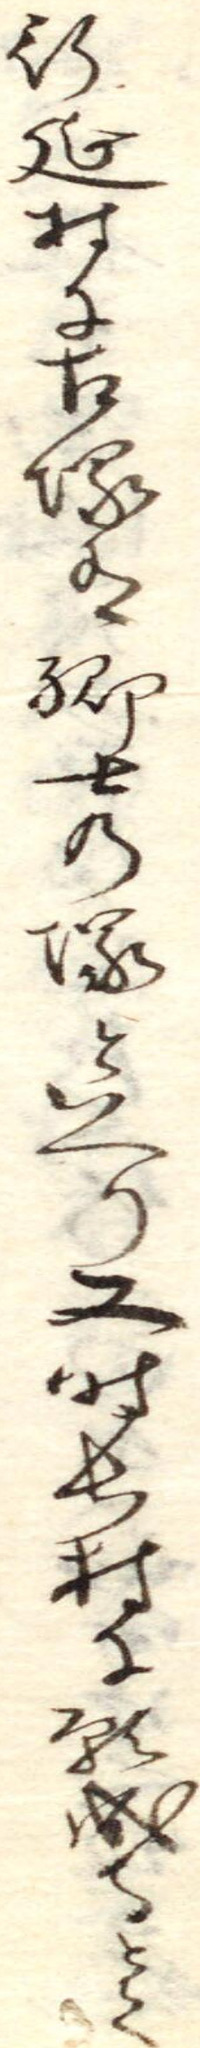行延村に古塚有郷士の塚といへり又時長村に願成寺とて
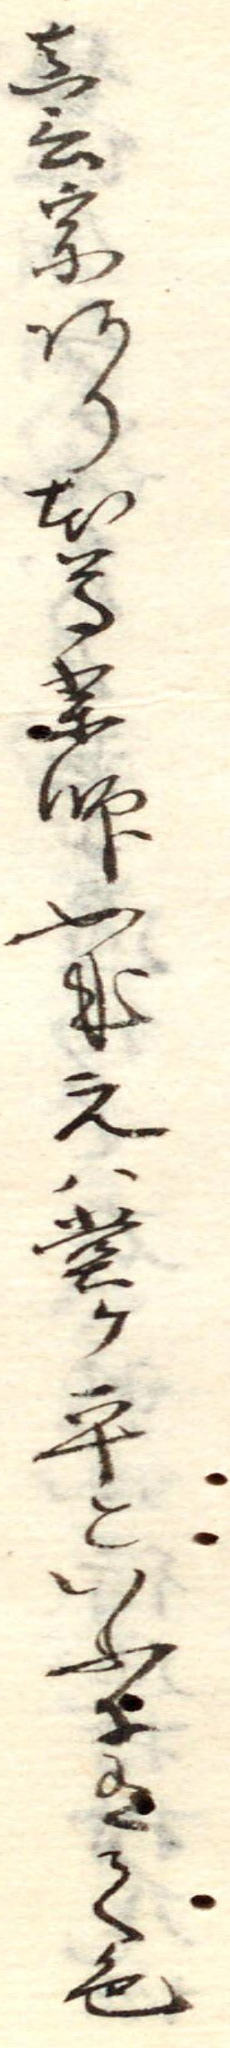真言宗あり本尊薬師如来元は堂ヶ平といふに有て色
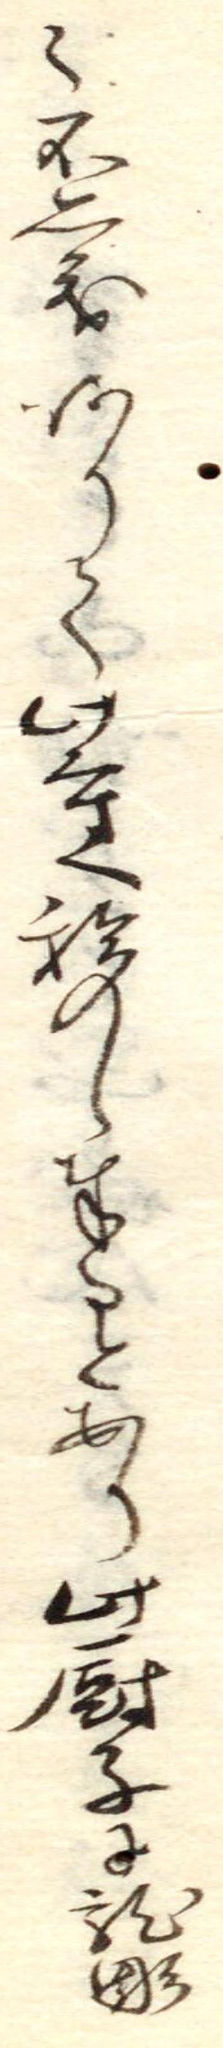々不思議ありて此寺へ移し奉るとあり此厨子に龍彫
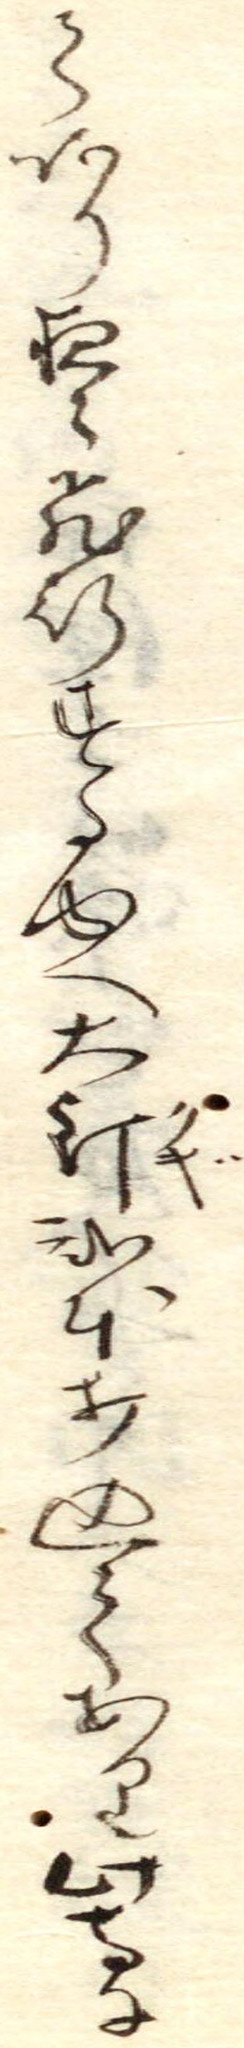てあり夜に飛行するゆへ大釘弐本打込てあり此寺に
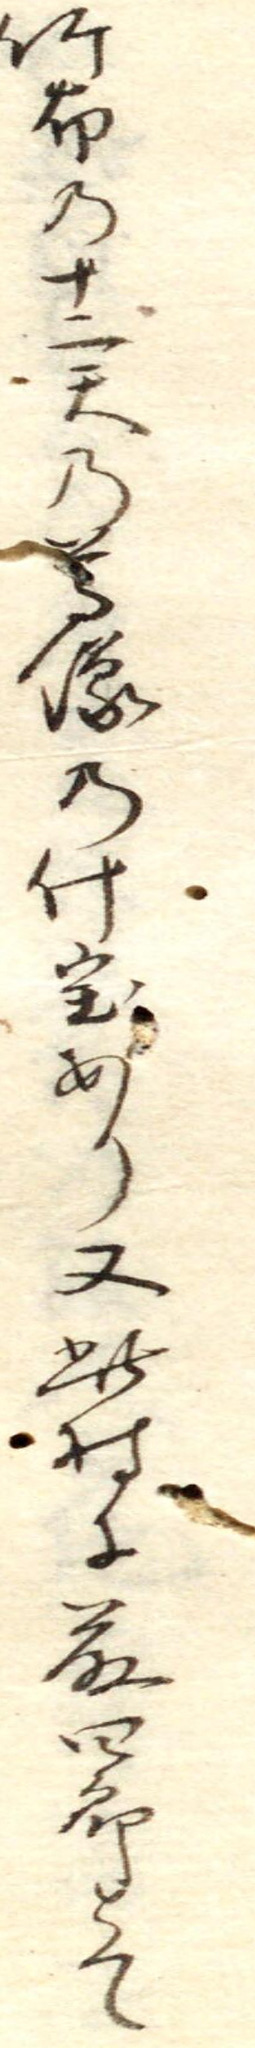竹布の十二天の尊像の什宝あり又此村に藤四郎とて
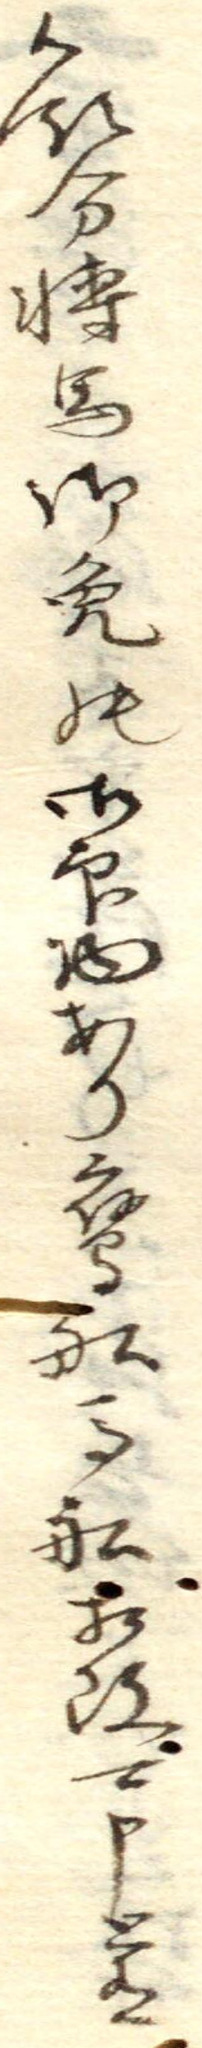御領分転馬御免の御印物あり鷹船馬船相改可申と有

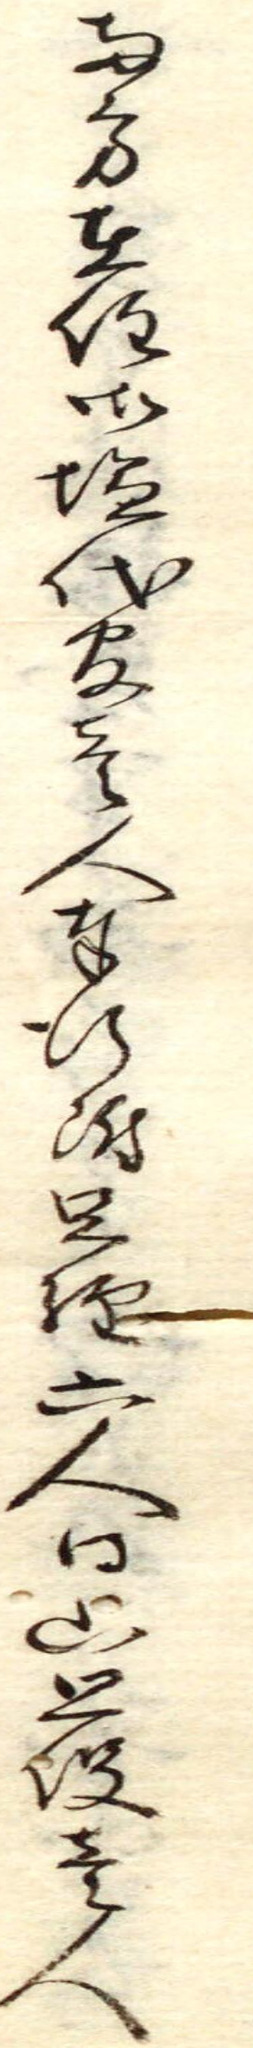両方在住御塩代官壱人奉行附足軽六人同山廻役壱人
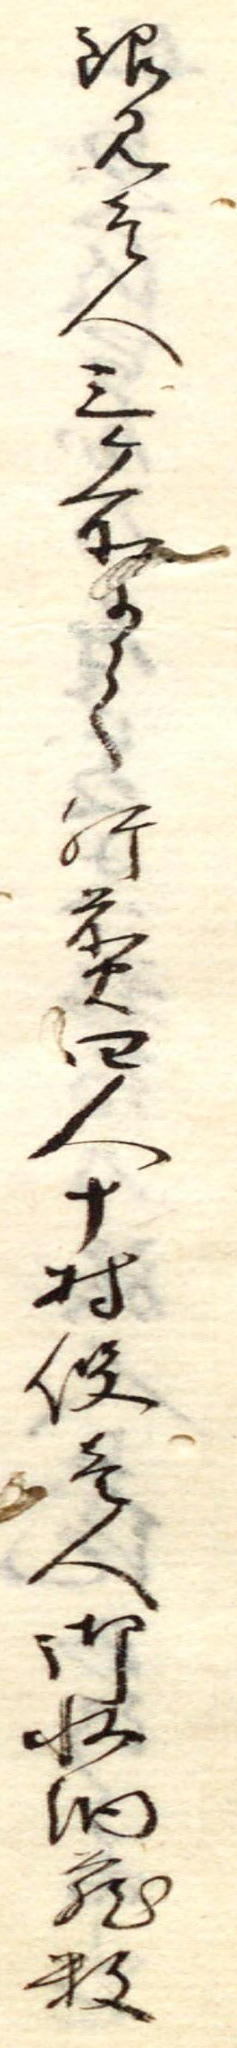限見壱人三ヶ所にて肝煎四人十村役壱人御収納蔵数
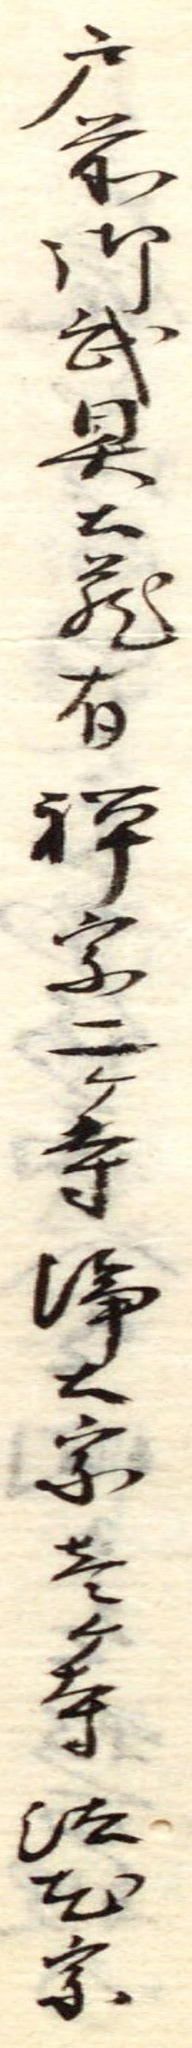戸前御武具土蔵有禅宗二ヶ寺浄土宗壱ヶ寺法花宗
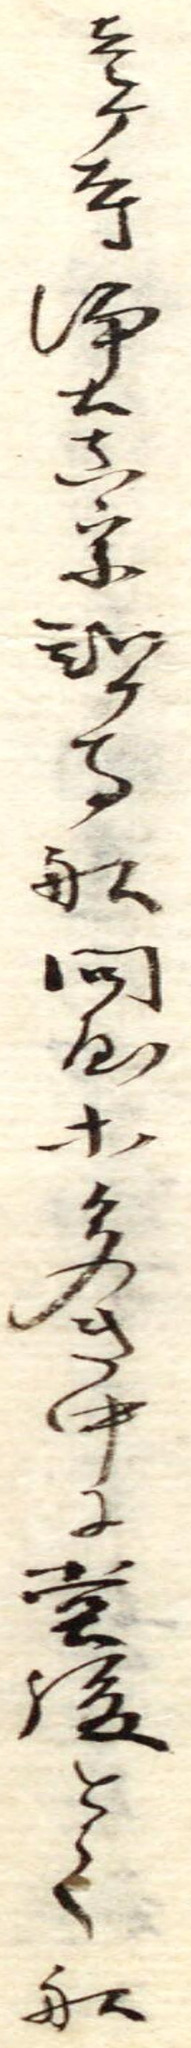壱ヶ寺浄土真宗弐ヶ寺船問屋等多き中に堂後とて船
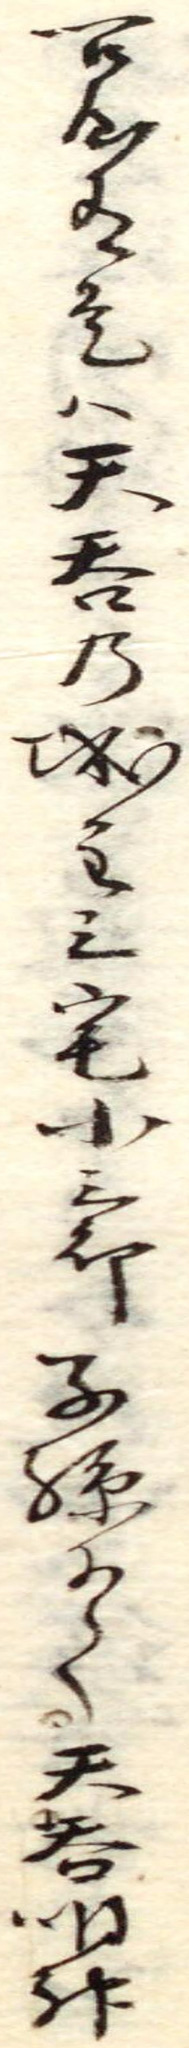問屋有是は天呑の城主三宅小三郎子孫にて天呑明神
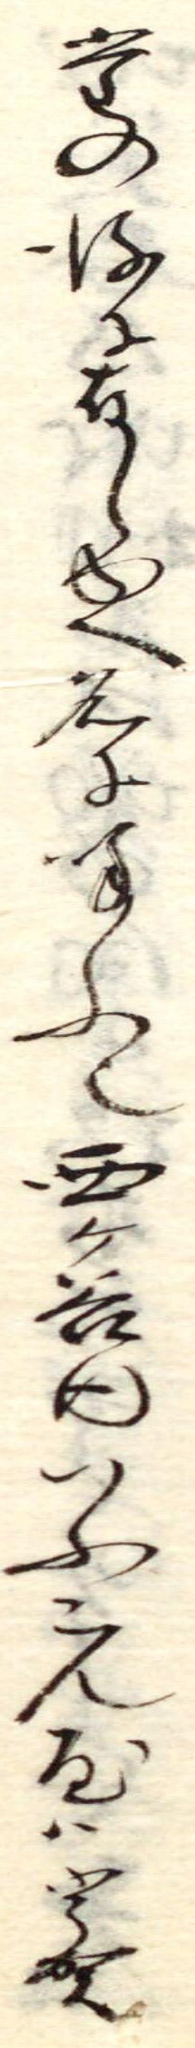堂の後に有しゆへ名に呼ふ也西ヶ谷内いふこん屋は宇賀
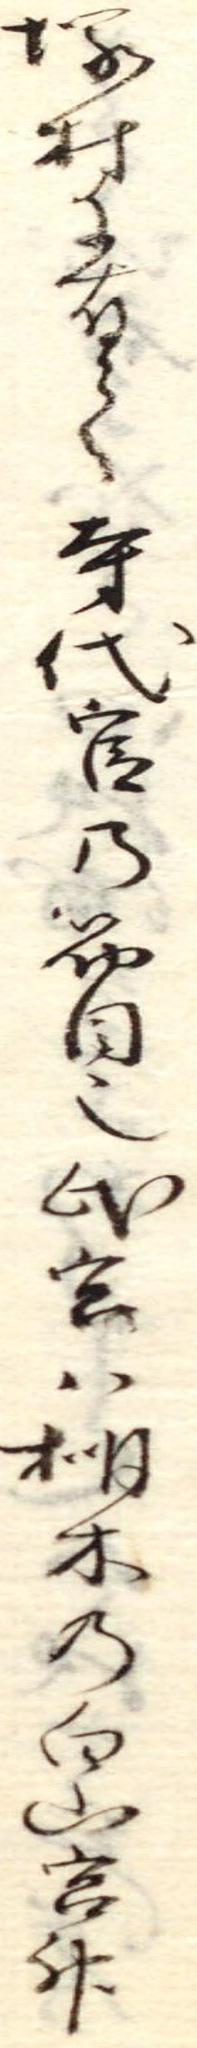塚村に有て寺代官の筋目也氏宮は棚木の白山宮神
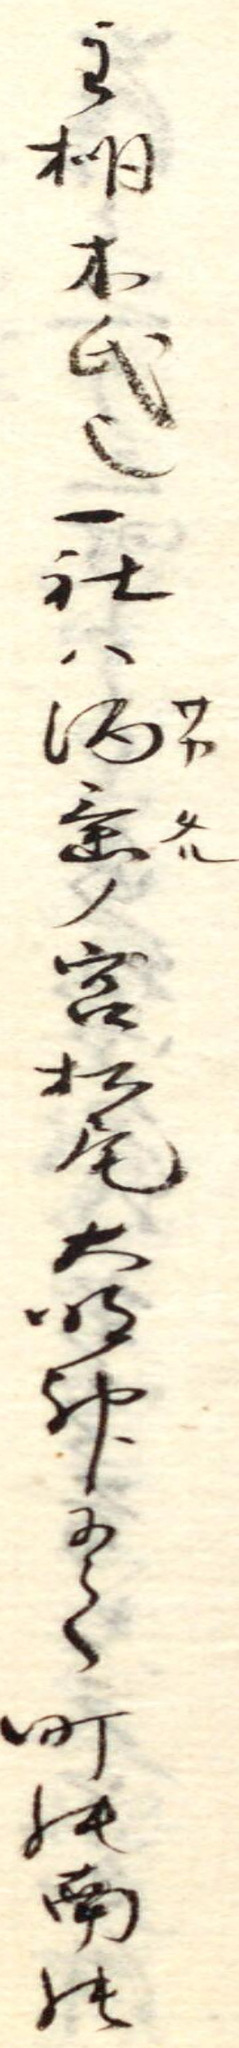主棚木氏也一社は酒罍ノ宮松尾大明神にて町の南の
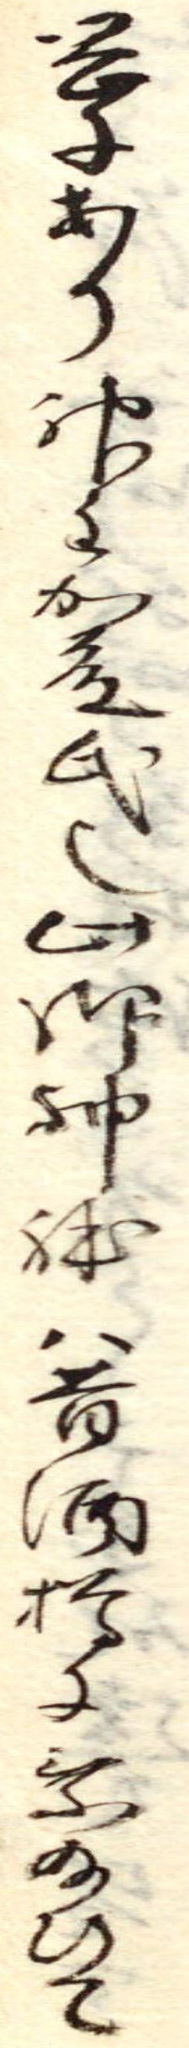岡にあり神主加藤氏也此御神躰は昔酒樽に乗給ひて
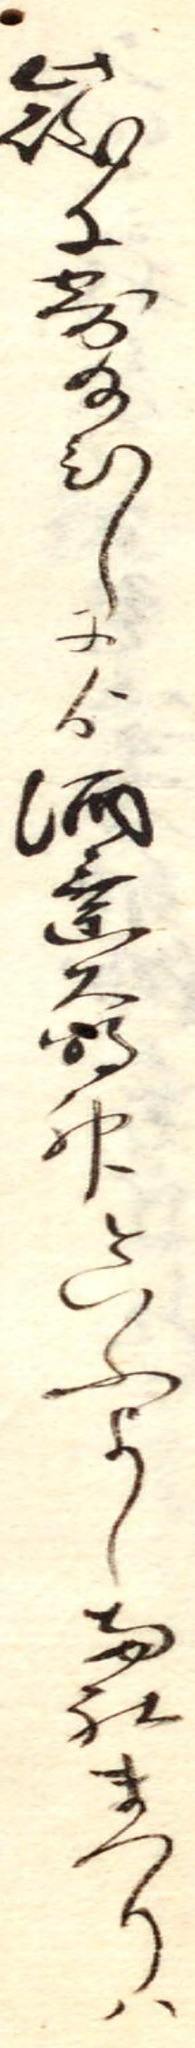此礒に寄給ひしにゟ酒罍大明神といふよし両社まつりは
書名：能登名跡誌
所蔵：Ishikawa Prefectural Library
